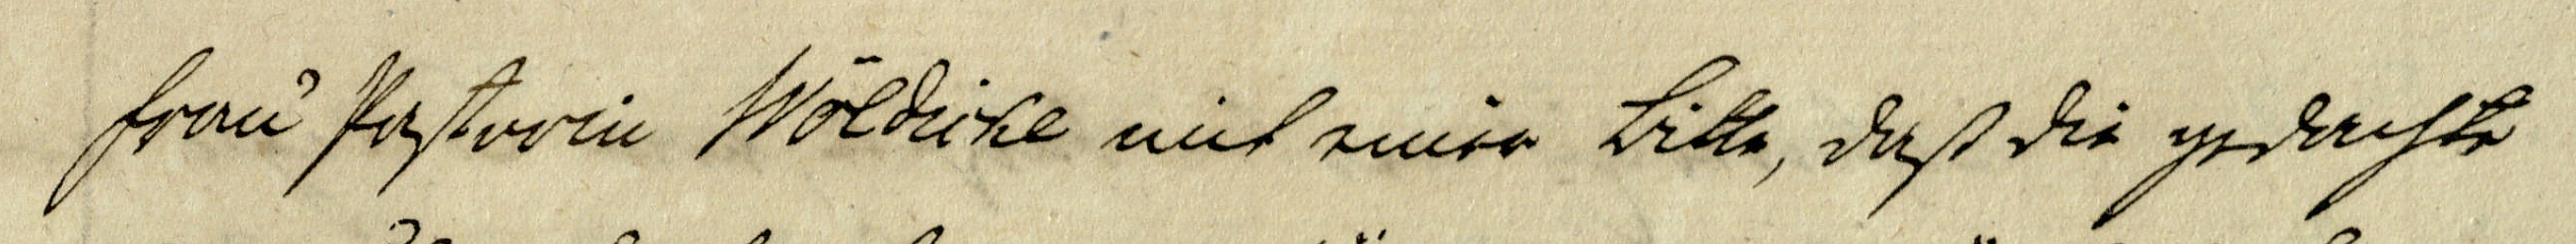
Frau Pastorin Wöldicke mit einer Bitte, daß die gedachte
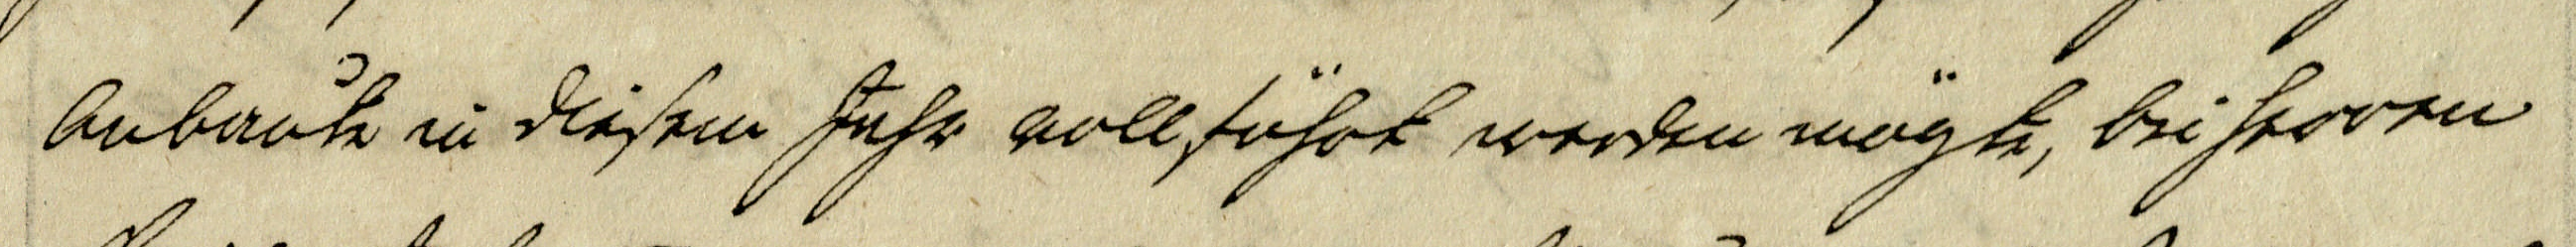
Anbaute in diesem Jahr vollführt werden mögte, bei Herren
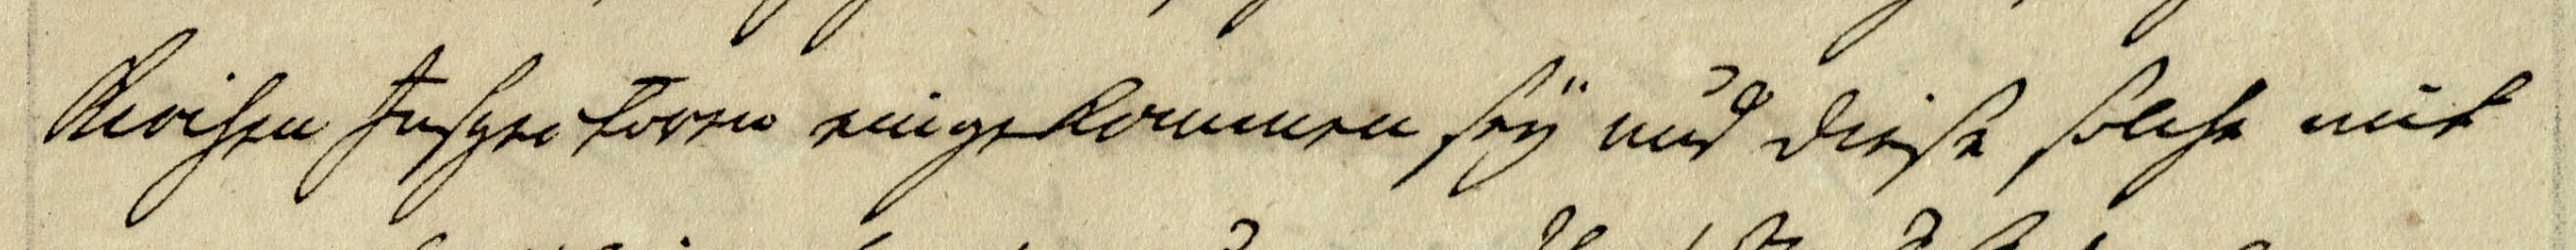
Kirchen Inspectoren eingekommen seÿ und diese solche mit
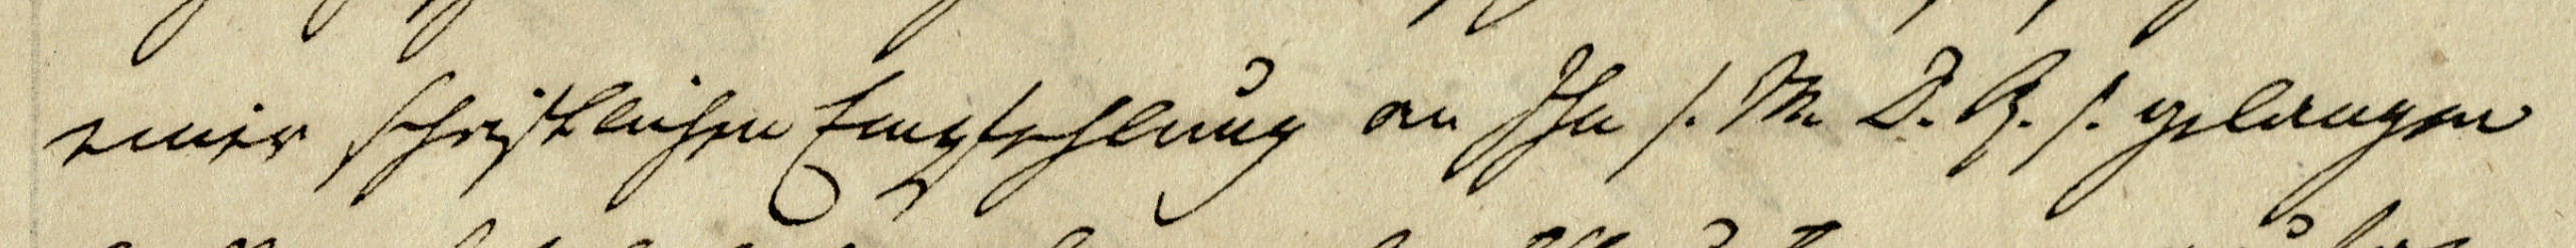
einer schriftlichen Empfehlung an Ihn /. M. D. R. /. gelangen
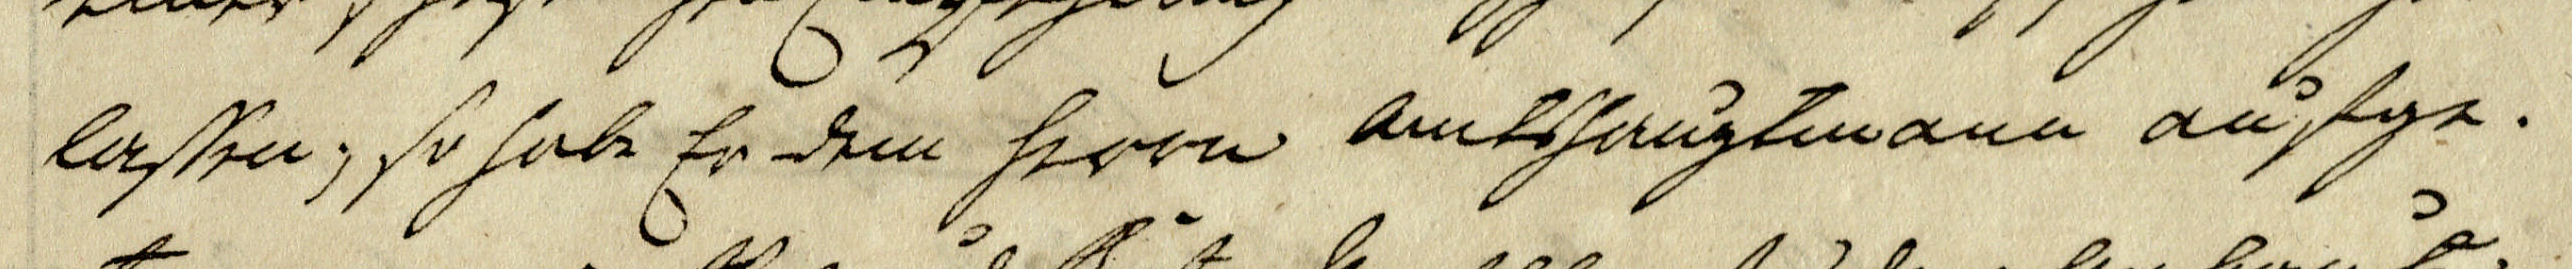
lassen; so habe Er dem Herrn Amtshauptmann aufge¬
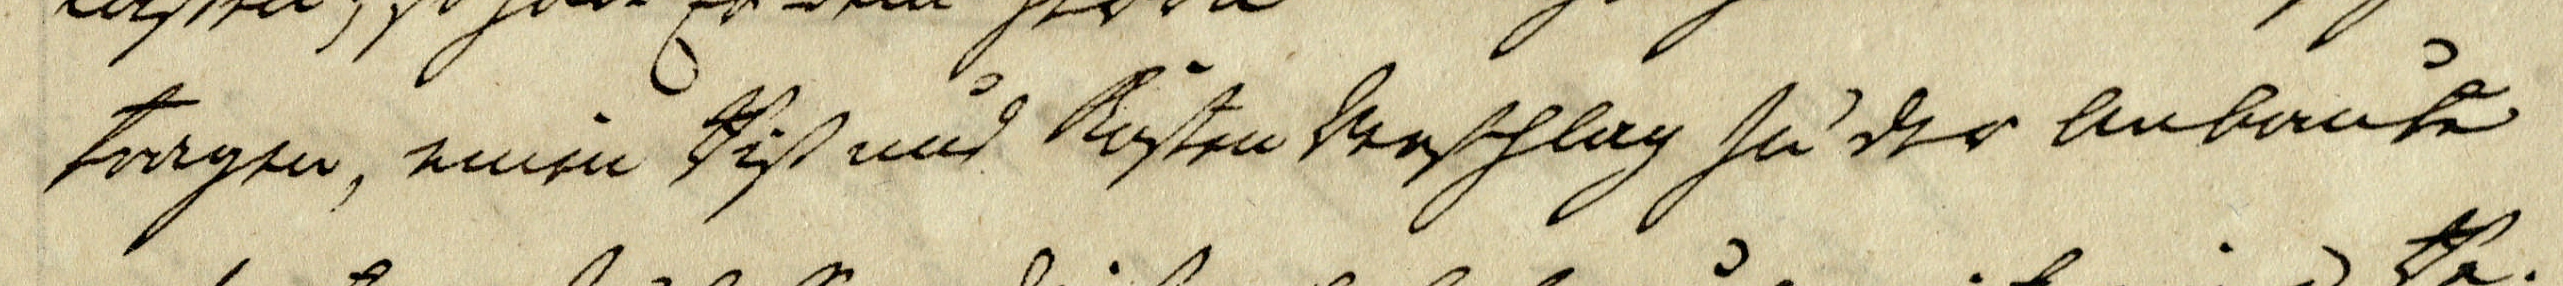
tragen, einem Riß und Kosten Verschlag zu der Anbaute
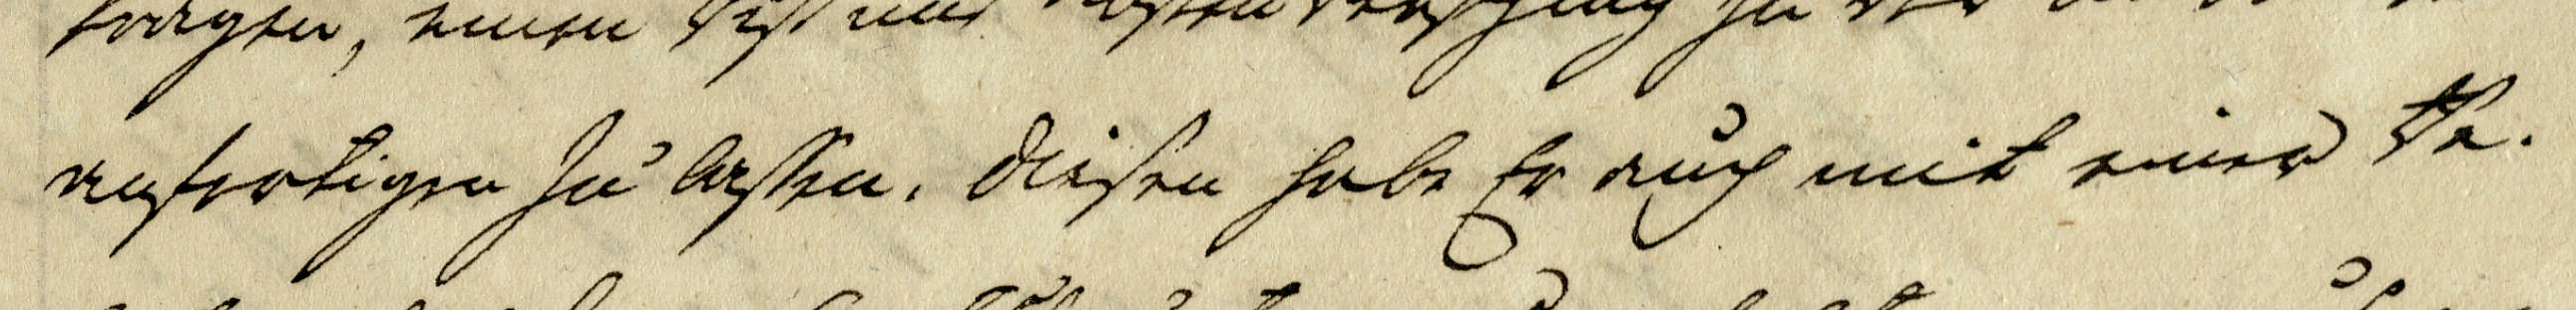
anfertigen zu lassen. Diesen habe Er auch mit einer Re¬
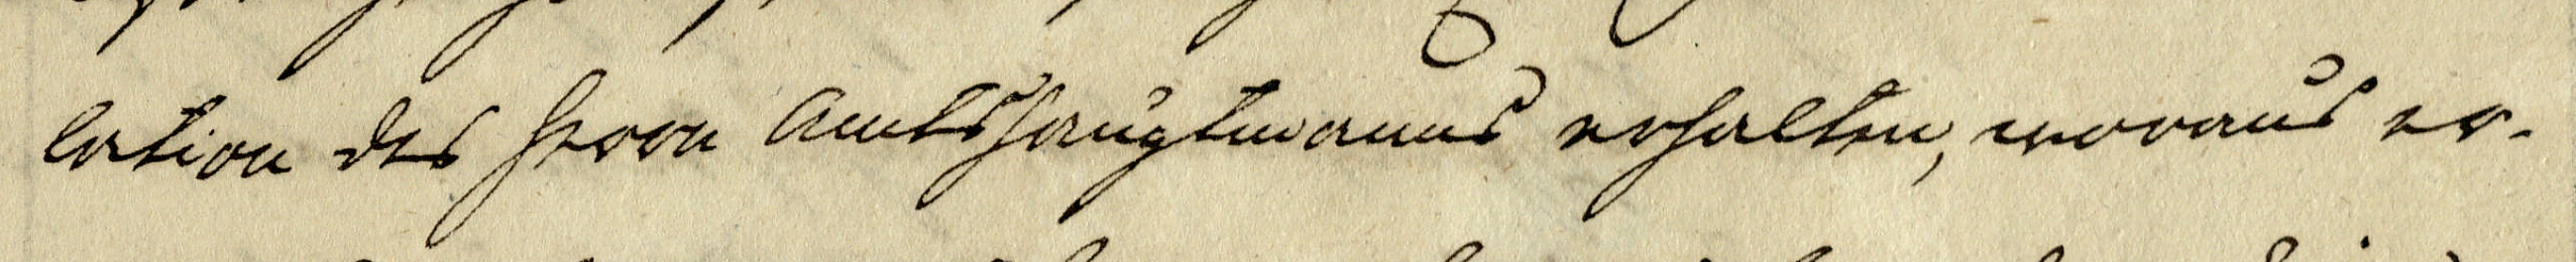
lation des Herrn Amtshauptmanns erhalten, woraus er¬
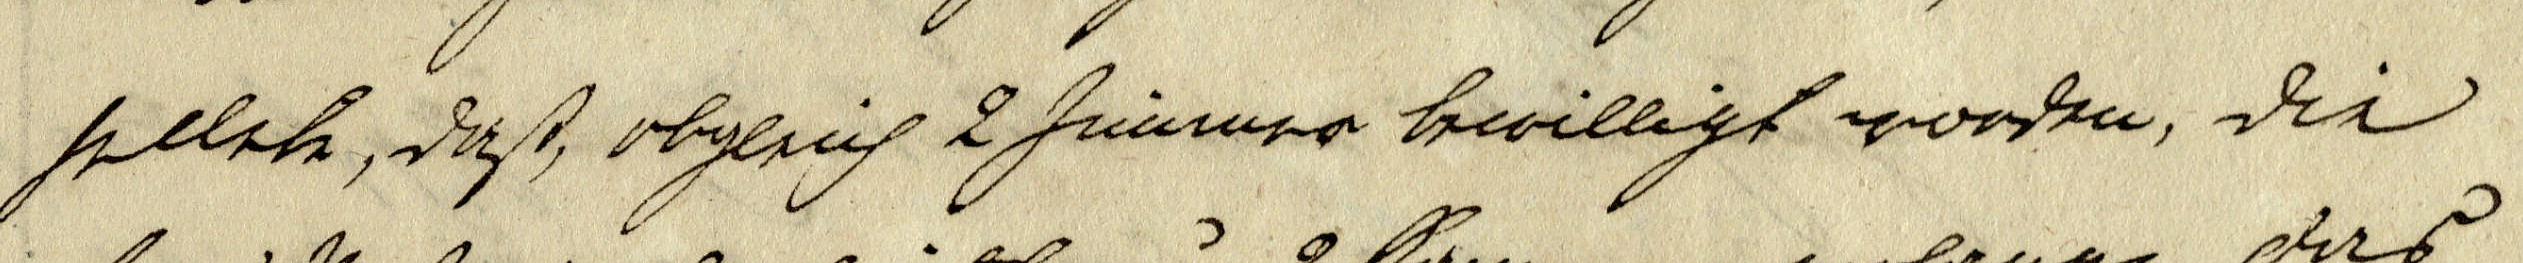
hellete, daß, obgleich 2 Zimmer bewilligt worden, die
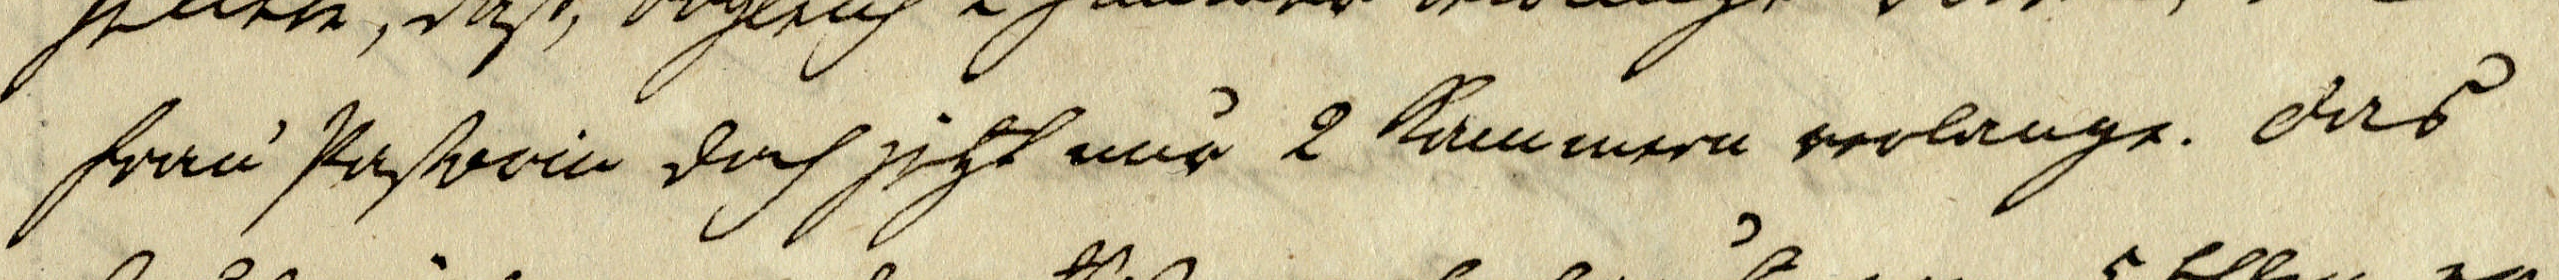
Frau Pastorin doch jetzt nur 2 Kammern verlange. Das
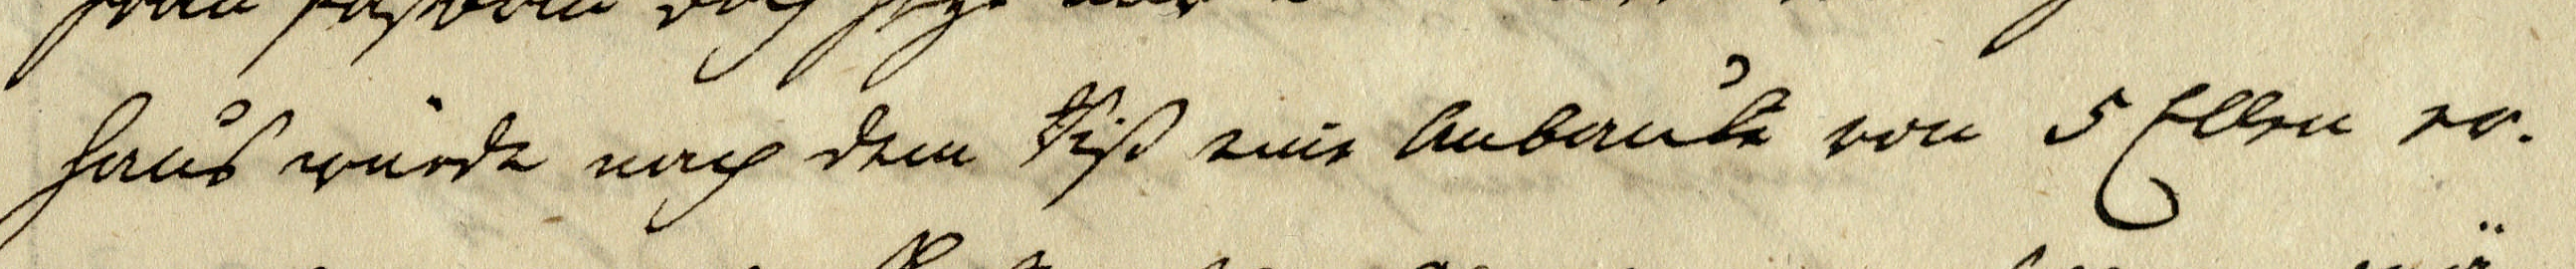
Haus würde nach dem Riß eine Anbaute von 5 Ellen er¬
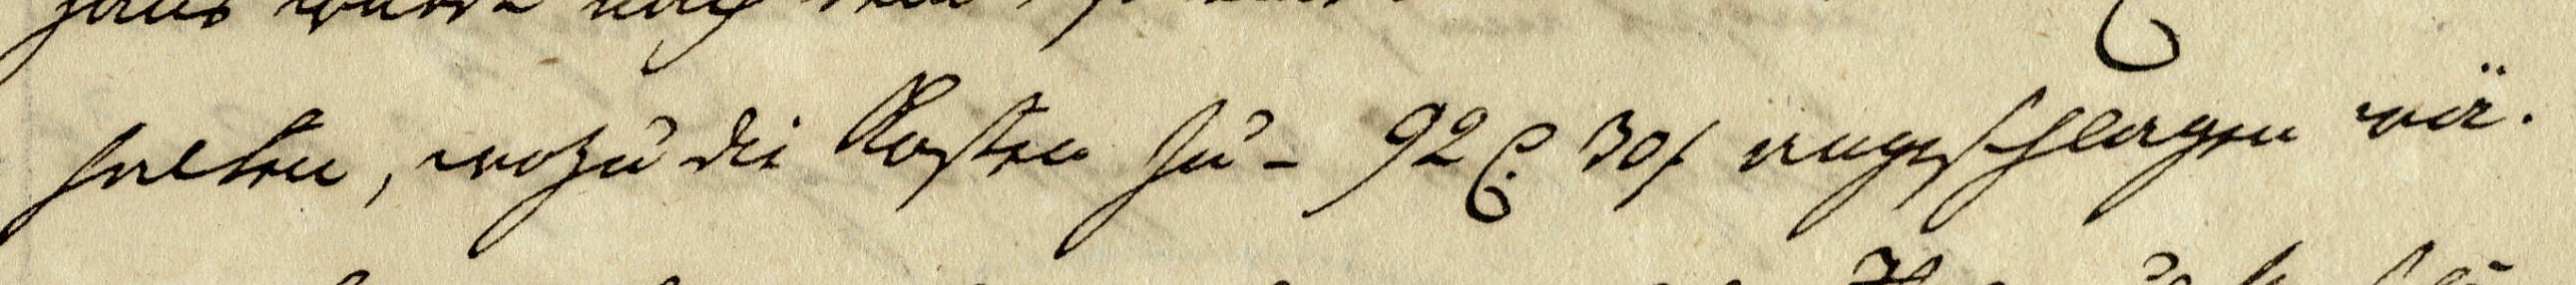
halten, wozu die Kosten zu - 92 l. 30 s. angeschlagen wä¬
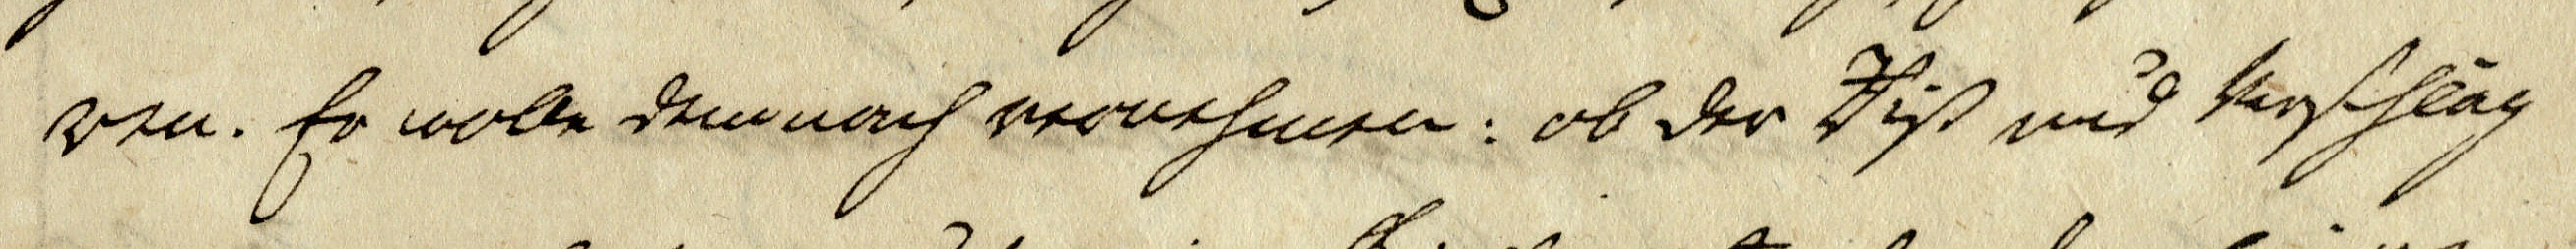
ren. Er wolle demnach vernehmen: ob der Riß und Verschlag
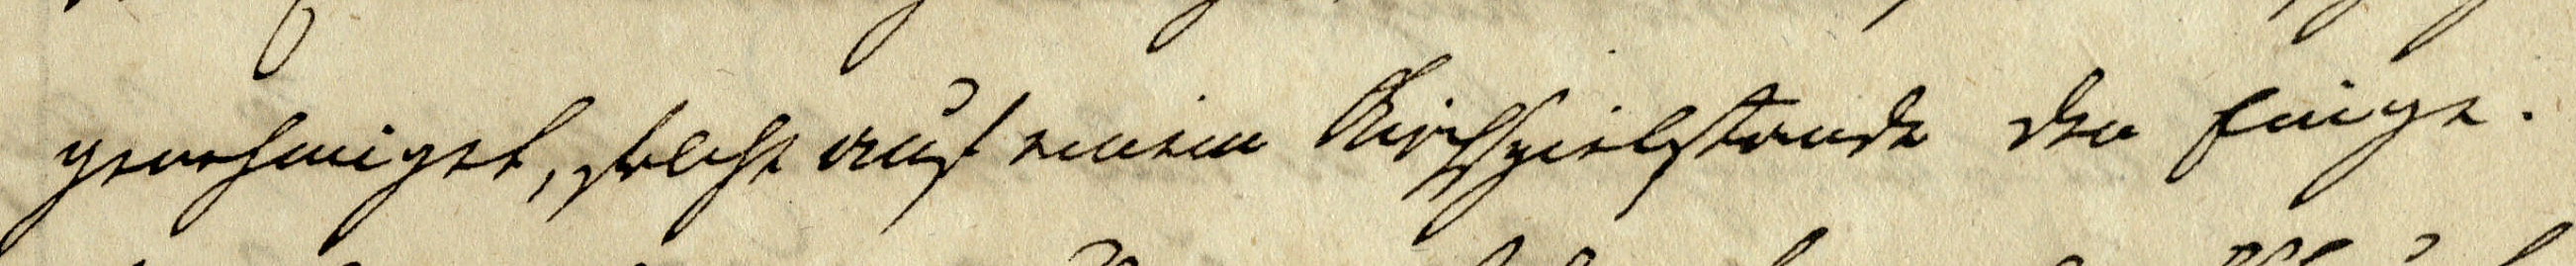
genehmiget, solche auf einem Kirchspielstande den Einge¬
